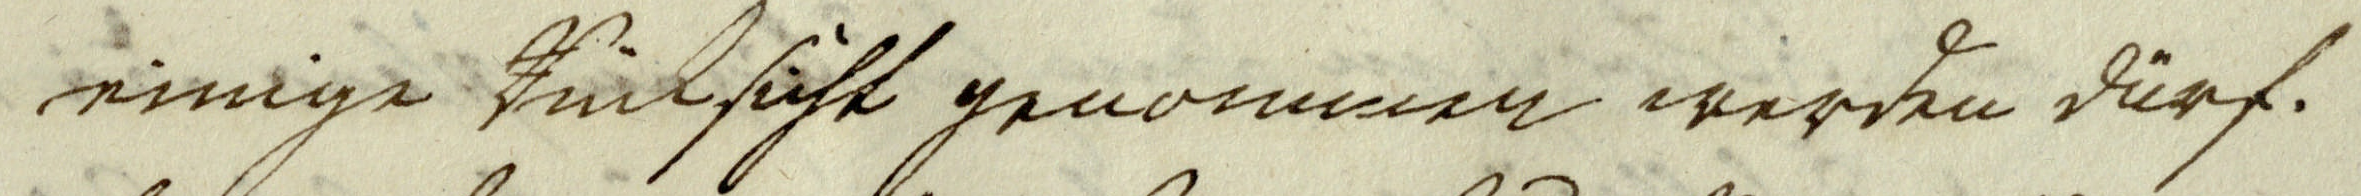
einige Rücksicht genommen werden dürf¬
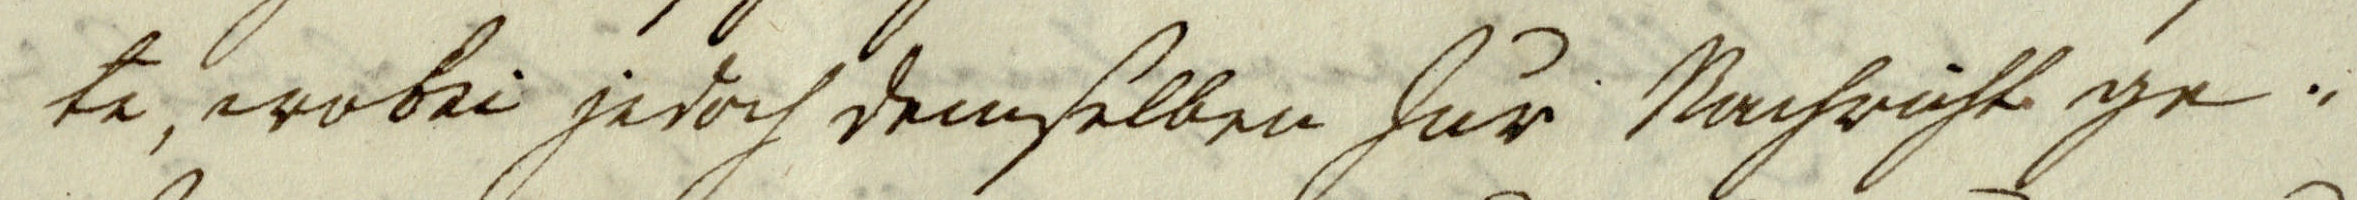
te, wobei jedoch demselben zur Nachricht ge¬
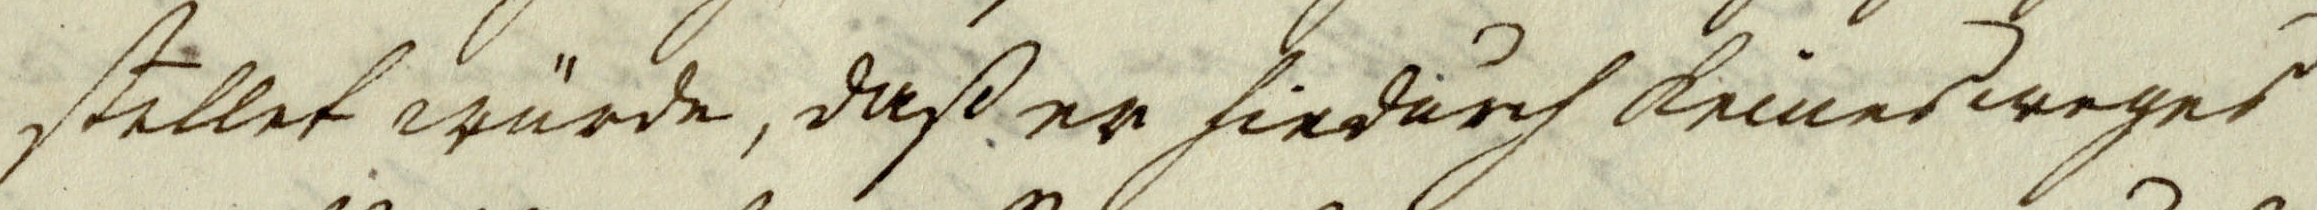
stellet würde, daß er hiedurch keinesweges
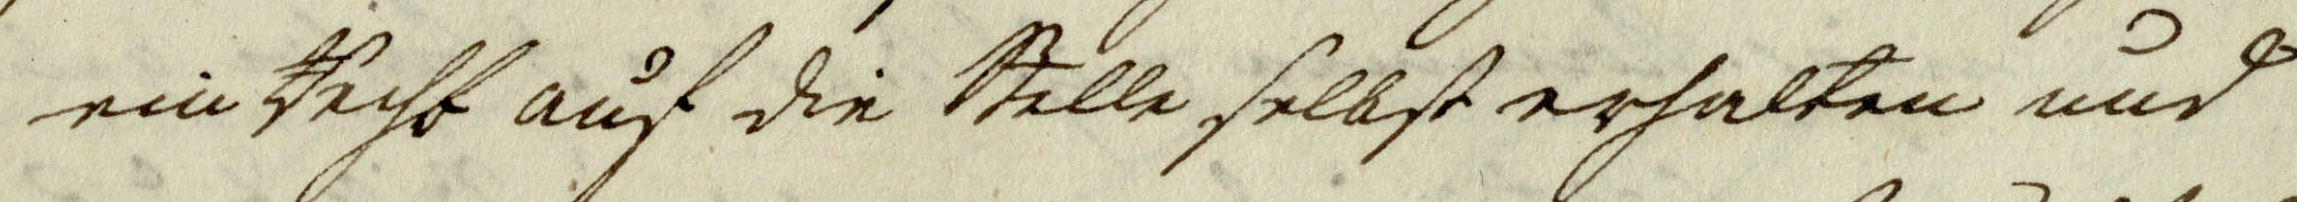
ein Recht auf die Stelle selbst erhalten und
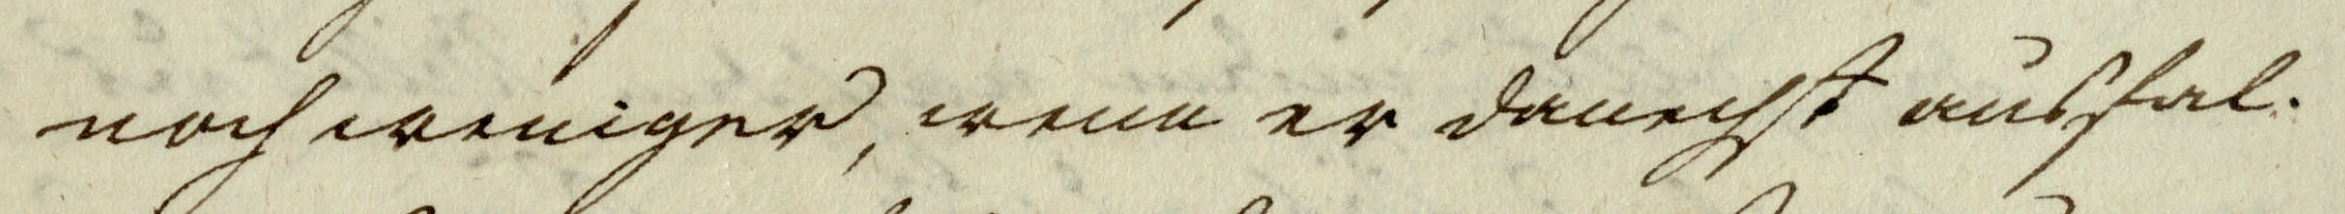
noch weniger, wenn er danechst ausfal¬
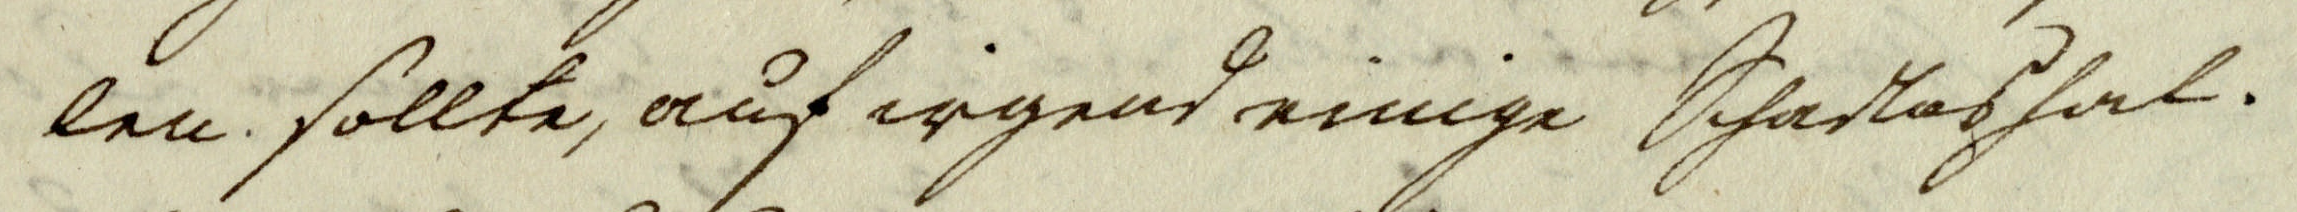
len sollte, auf irgend einige Schadenshaf¬
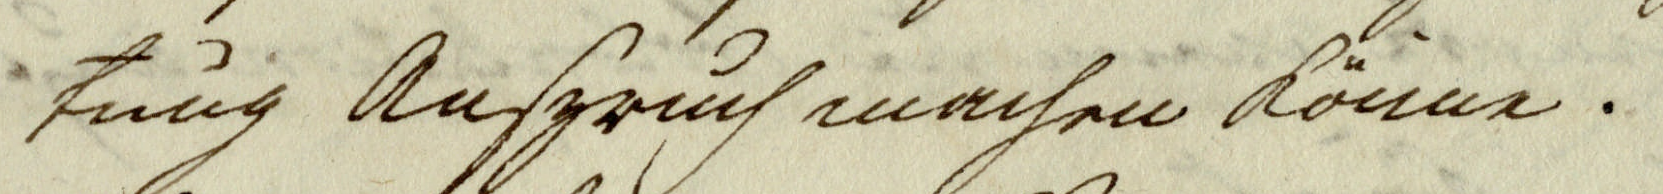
tung Anspruch machen könne.
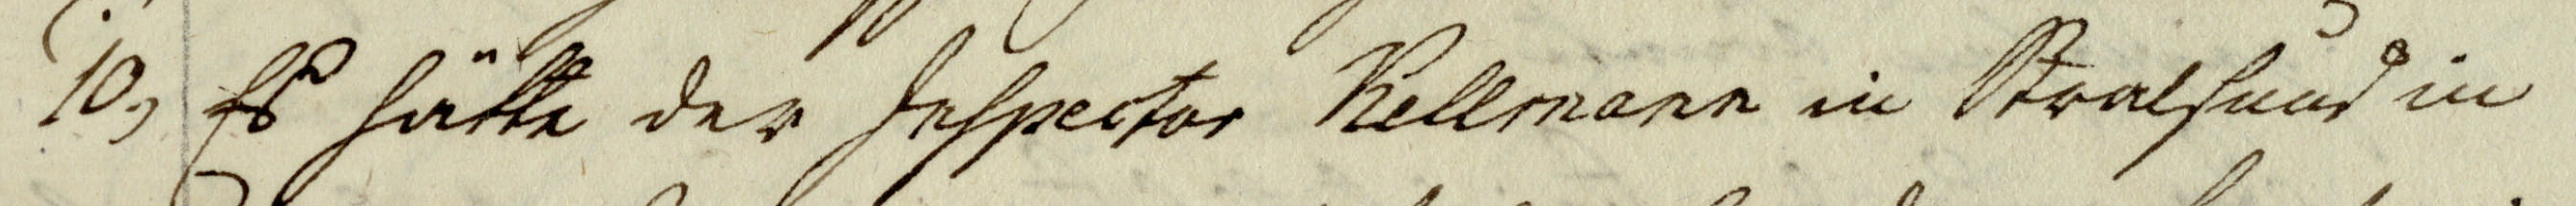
10., Es hätte der Inspector Kellmann in Stralsund in
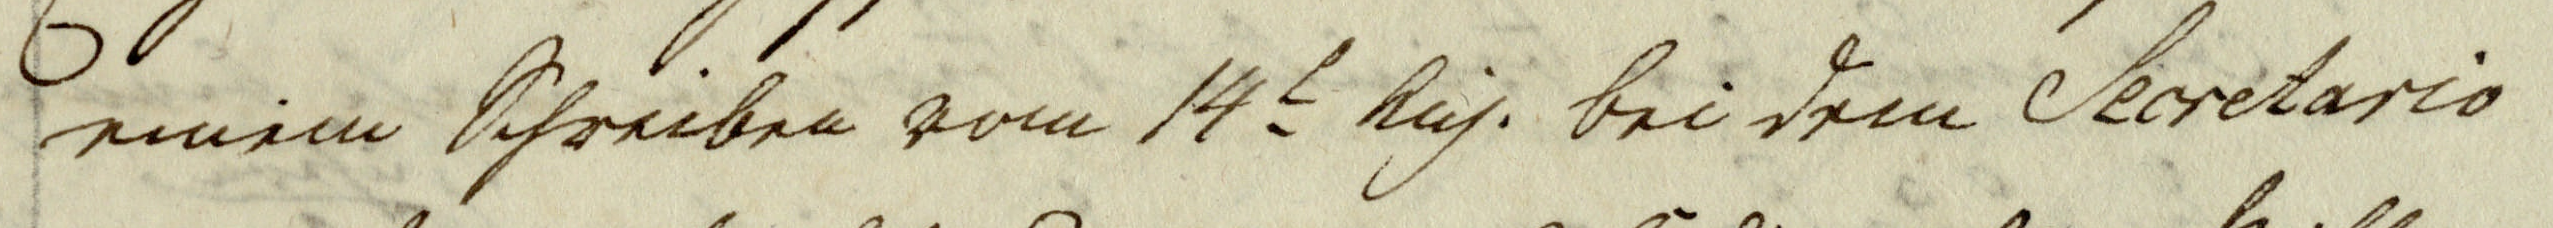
einem Schreiben vom 14t. huj. bei dem Secretario
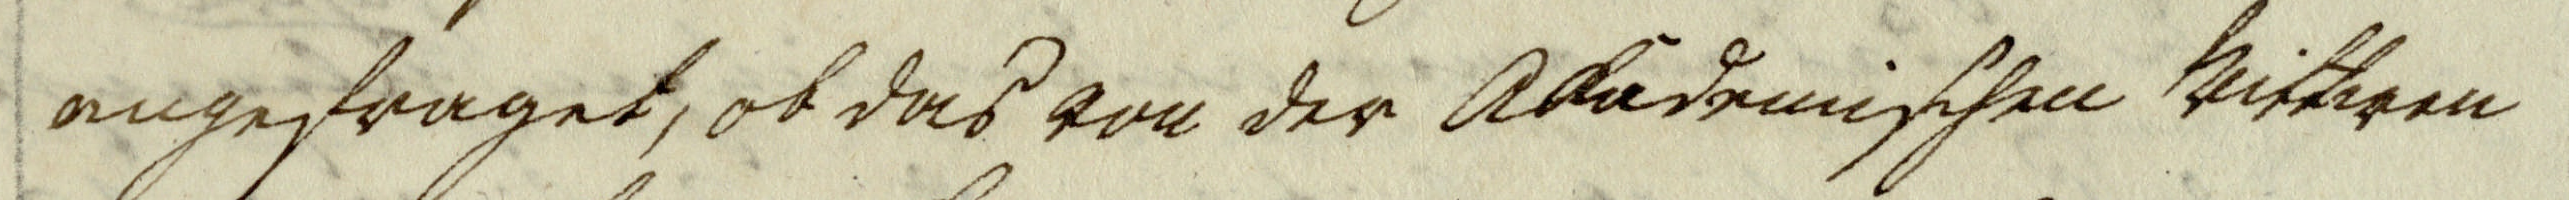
angefragt, ob das von der Akademischen Wittwen
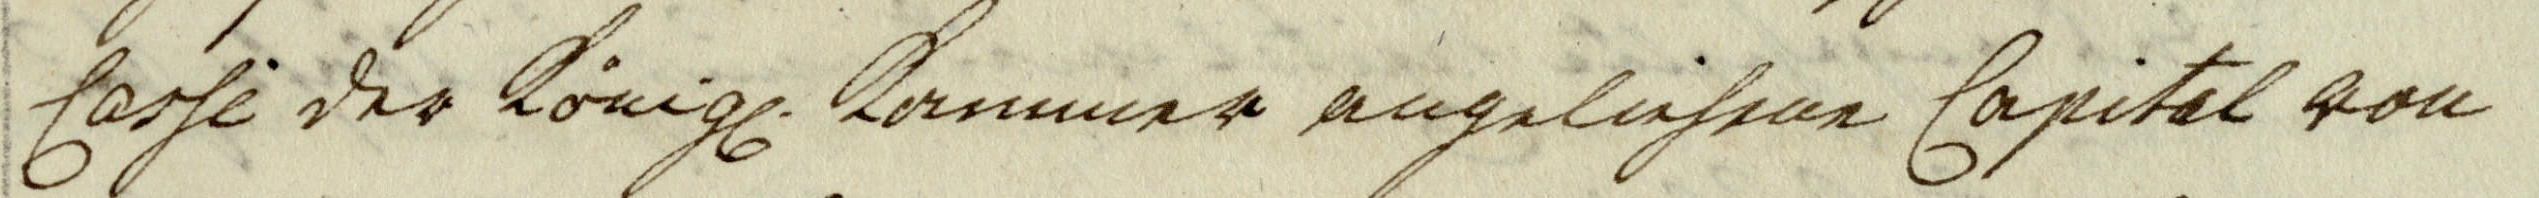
Casse der Königl. Kammer angeliehene Capital von
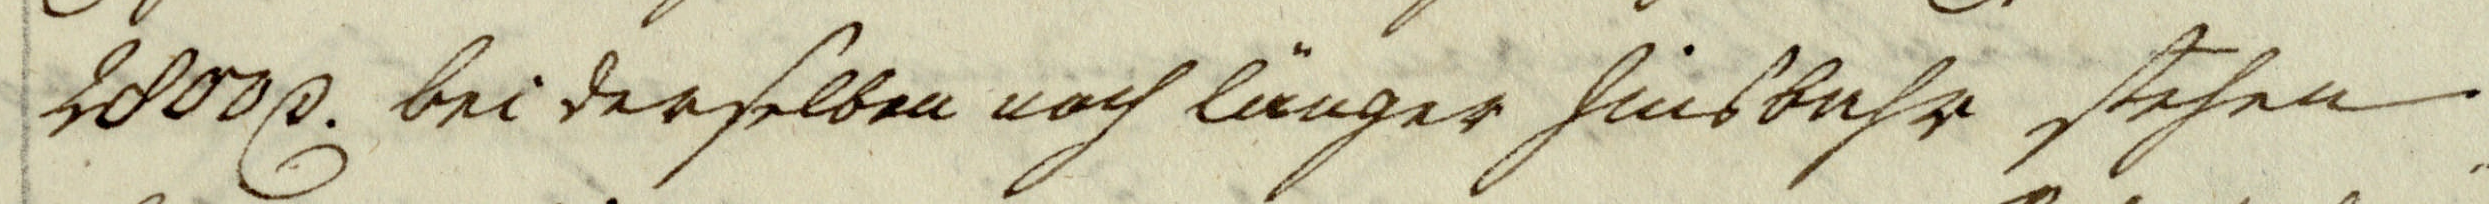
2800 rtl. bei derselben noch länger zinsbahr stehen
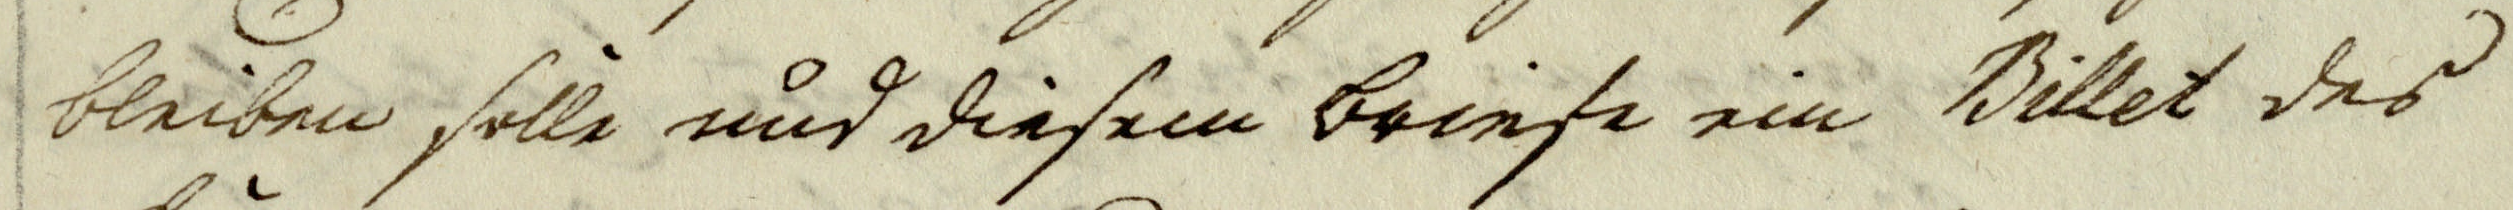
bleiben solle und diesem Briefe ein Billet des
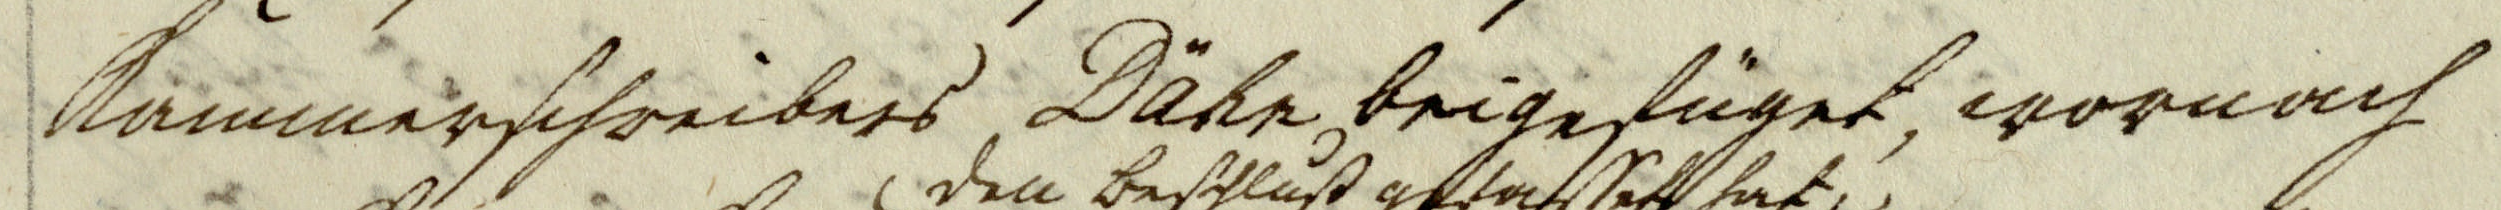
Kammerschreibers Dähn beigefügt, wornach
